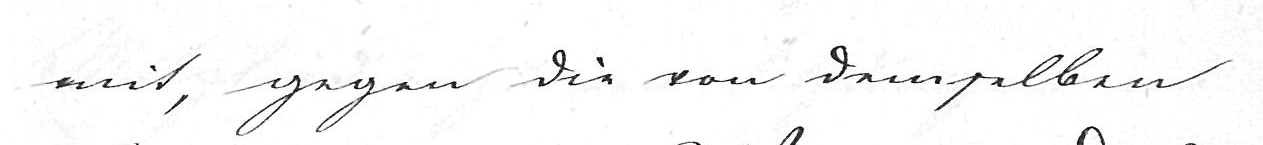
mit, gegen die von demselben
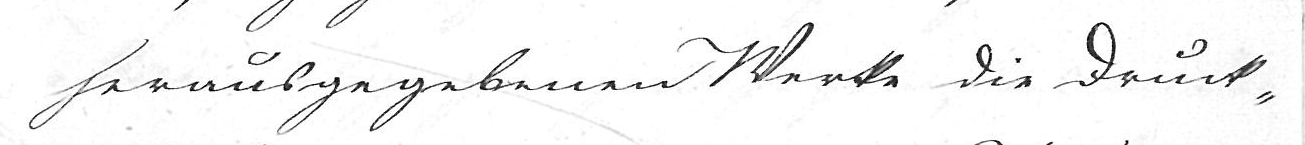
herausgegebenen Werke die Druck-
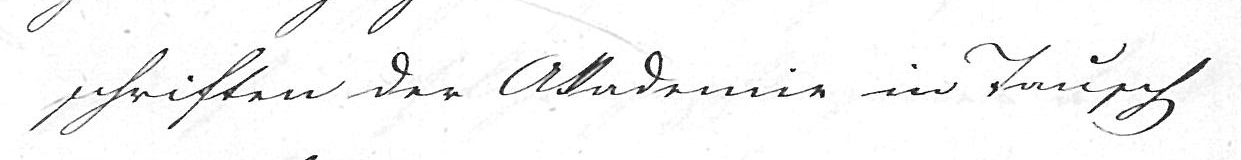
schriften der Akademie in Tausch
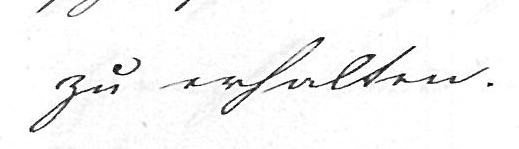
zu erhalten.
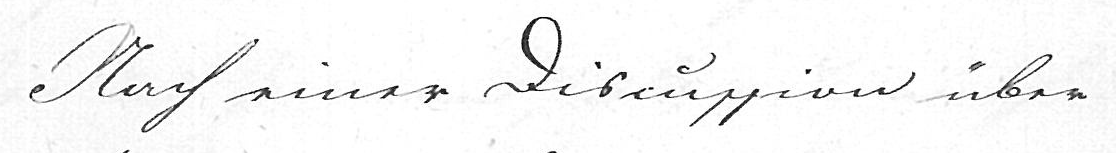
Nach einer Discussion über
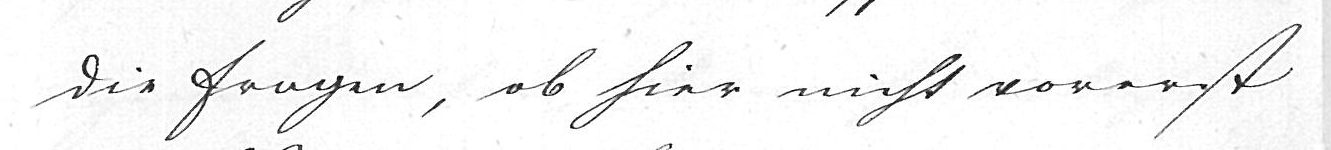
die Fragen, ob hier nicht vorerst
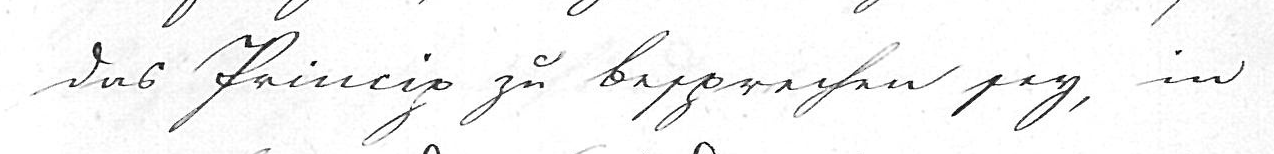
das Princip zu besprochen sey, in
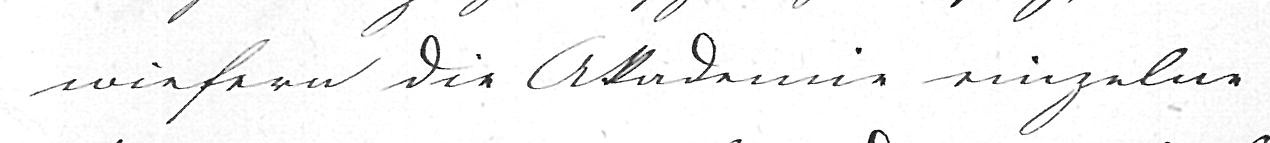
wiefern die Akademie einzelne
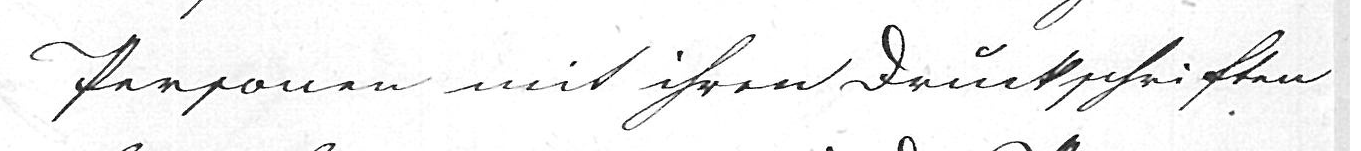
Personen mit ihren Druckschriften
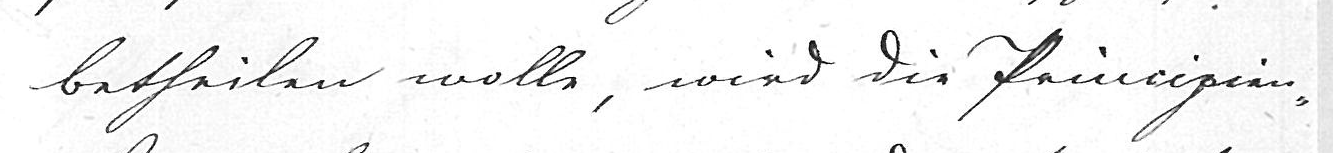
betheilen wolle, wird die Principien-
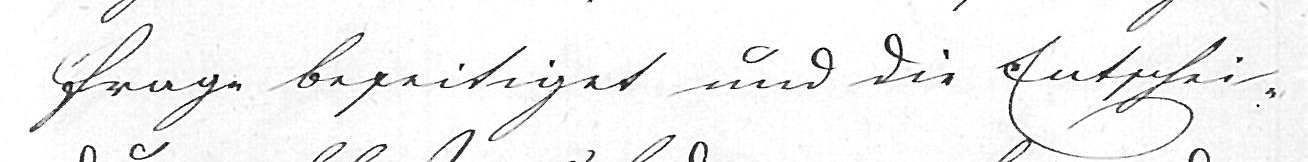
Frage beseitiget und die Entschei-
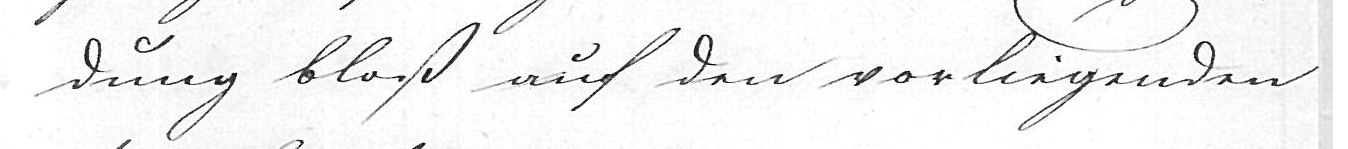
dung bloß auf den vorliegenden
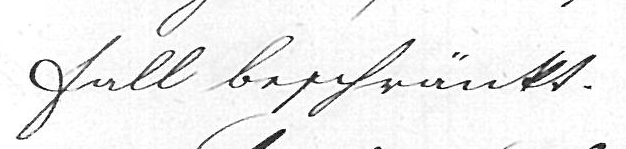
Fall beschränkt.
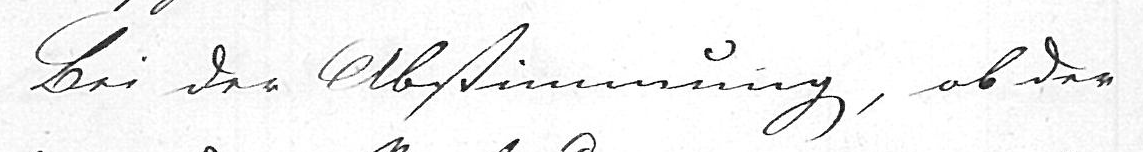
Bei der Abstimmung, ob der
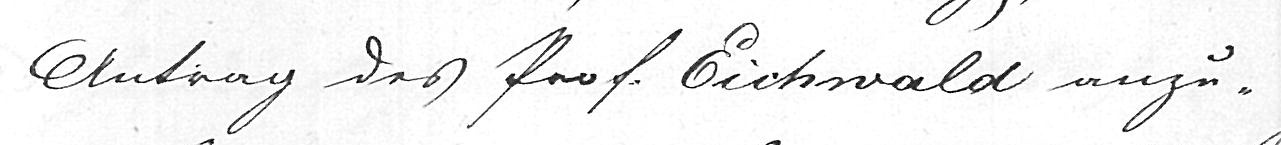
Antrag des Prof. Eichwald anzu-
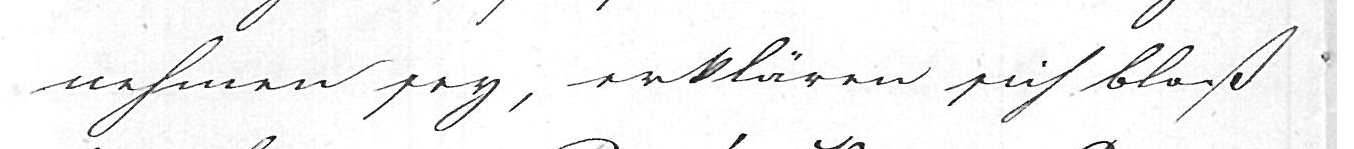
nehmen sey, erklären sich bloß
